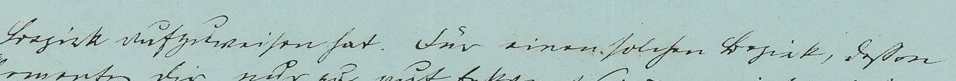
Bezirk aufzuweisen hat. Für einen solchen Bezirk, deßen
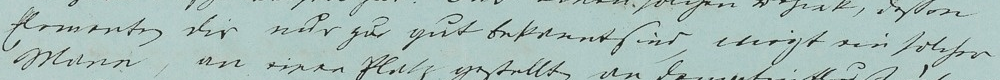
Elemente dir nur zu gut bekannt sind, wiegt ein solcher
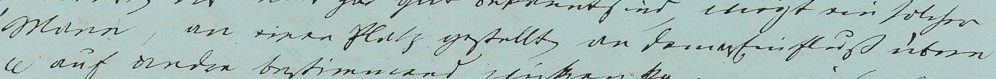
Mann, an einen Platz gestellt, an dem er Einfluß üben
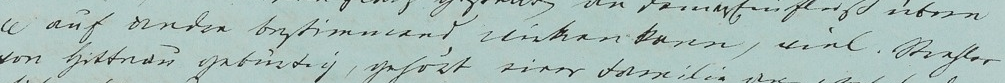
& auf andere bestimmend wirken kann, viel. Strehler
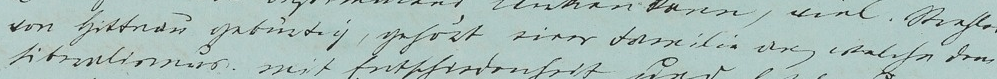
von Hittnau gebürtig, gehört einer Familie an, welche dem
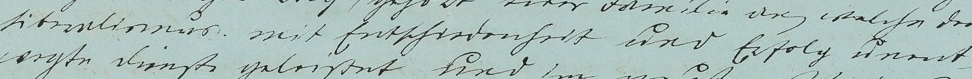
Liberalismus mit Entschiedenheit und Erfolg unent-
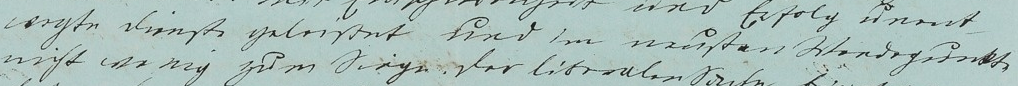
wegte Dienste geleistet und im neusten Wendepunkte
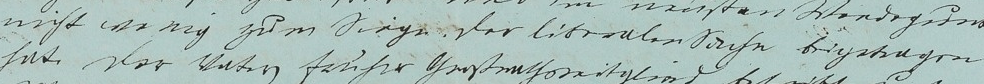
nicht wenig zum Siege der liberalen Sache beigetragen
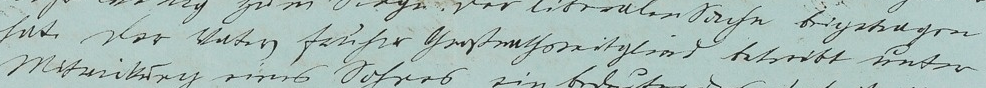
hat. Der Vater, früher Großrathsmitglied betreibt unter
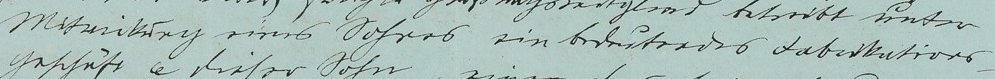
Mitwirkung eines Sohnes ein bedeutendes Fabrikations-
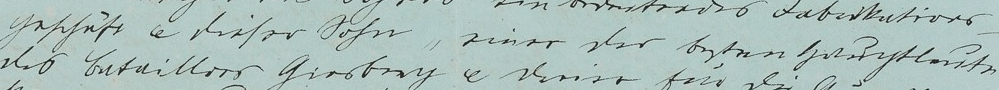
geschäft & dieser Sohn «einer der besten Hauptleute
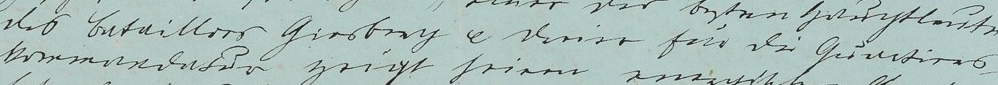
des Bataillons Ginsberg» & dreier für die Quartires -
